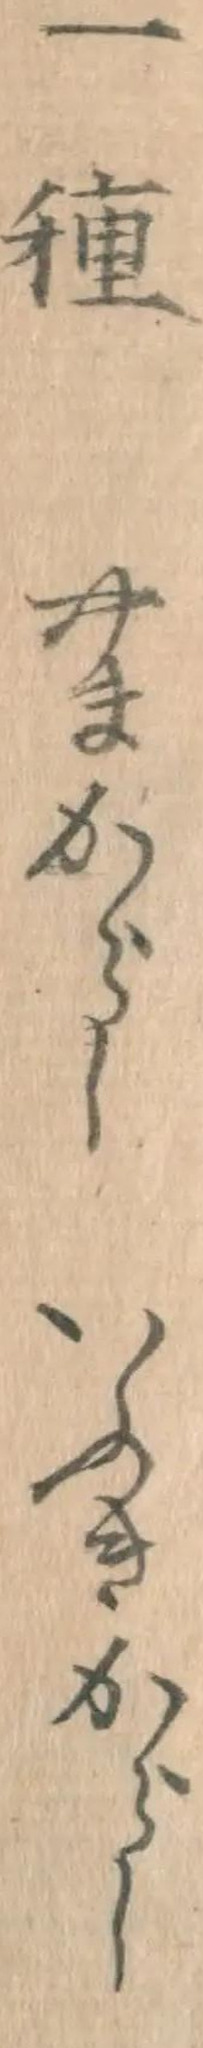一種やまからしいふきからし
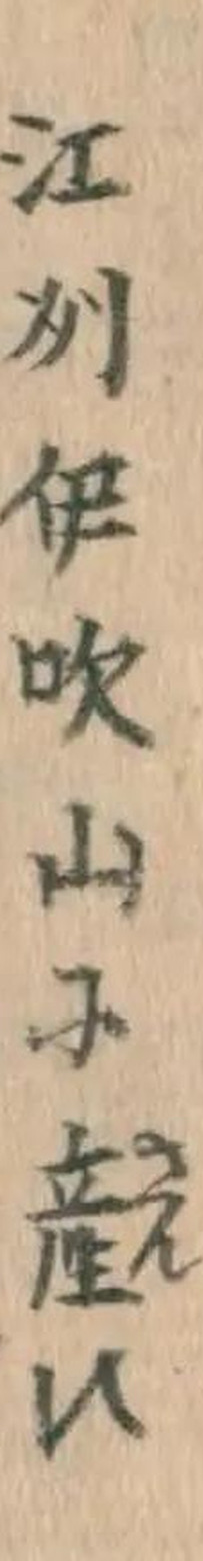江州伊吹山に産す
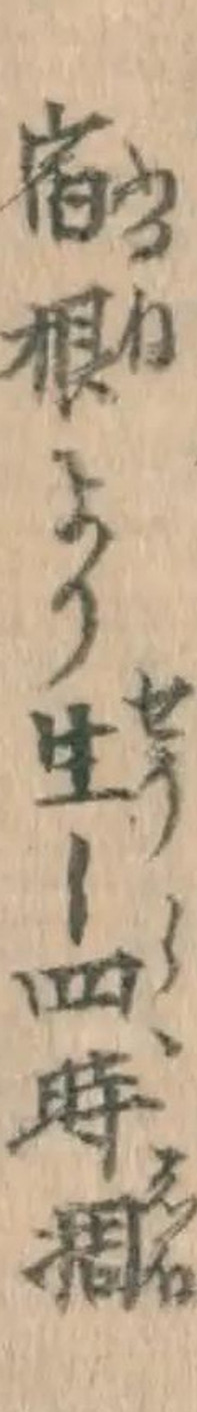宿根より生し四時凋
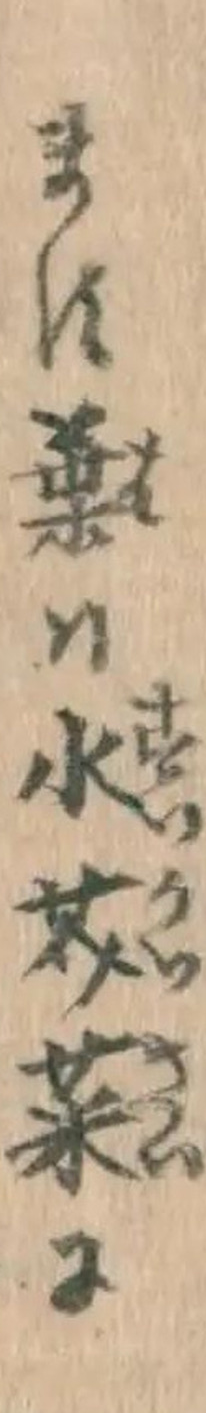ます葉は水芥菜に
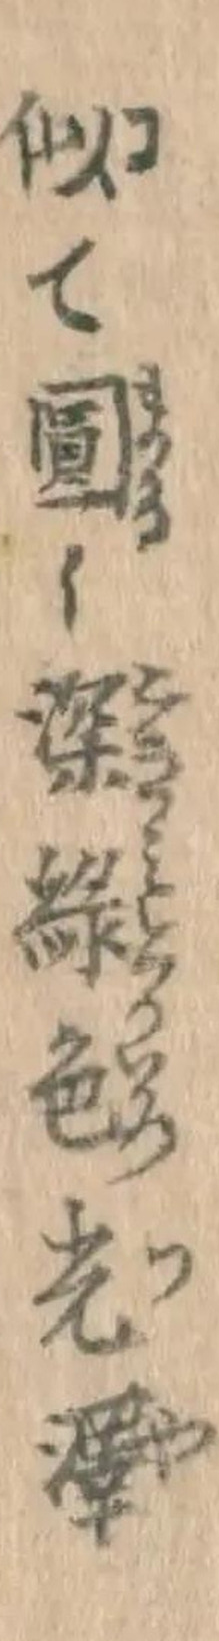似て円し深緑色光沢
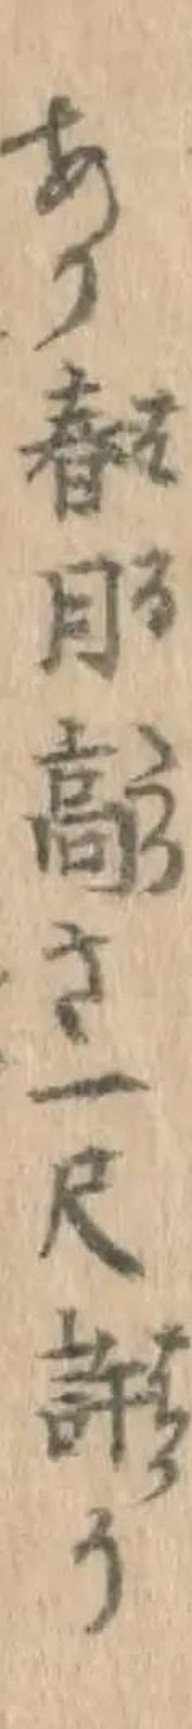あり春月高さ一尺許り
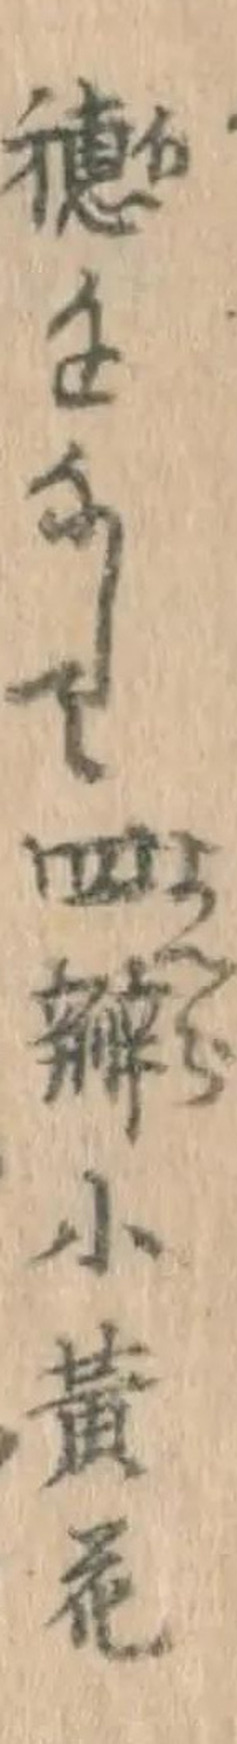穂をなして四弁小黄花
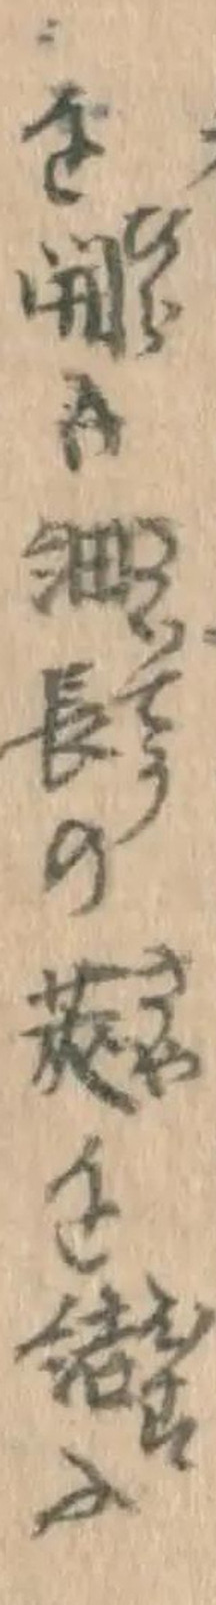を開き細長の莢を結ふ

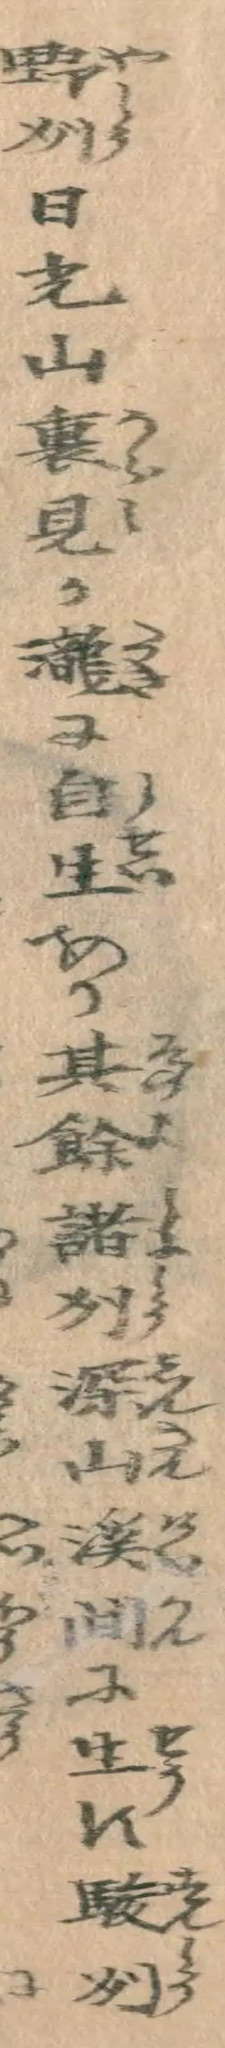野州日光山裏見か滝に自生あり其余諸州深山渓間に生す駿州
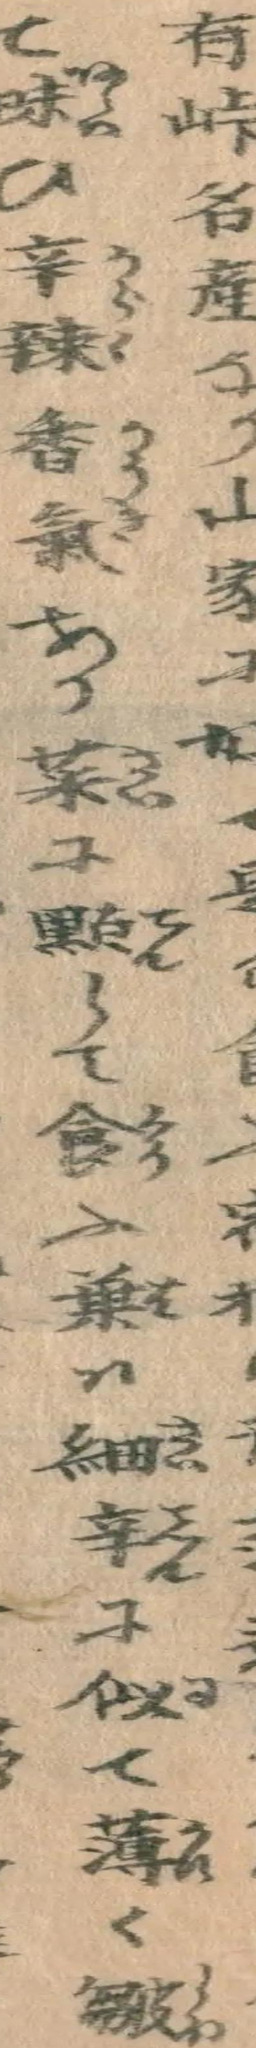て味ひ辛辣香気あり菜に点して食ふ葉は細辛に似て薄く皺
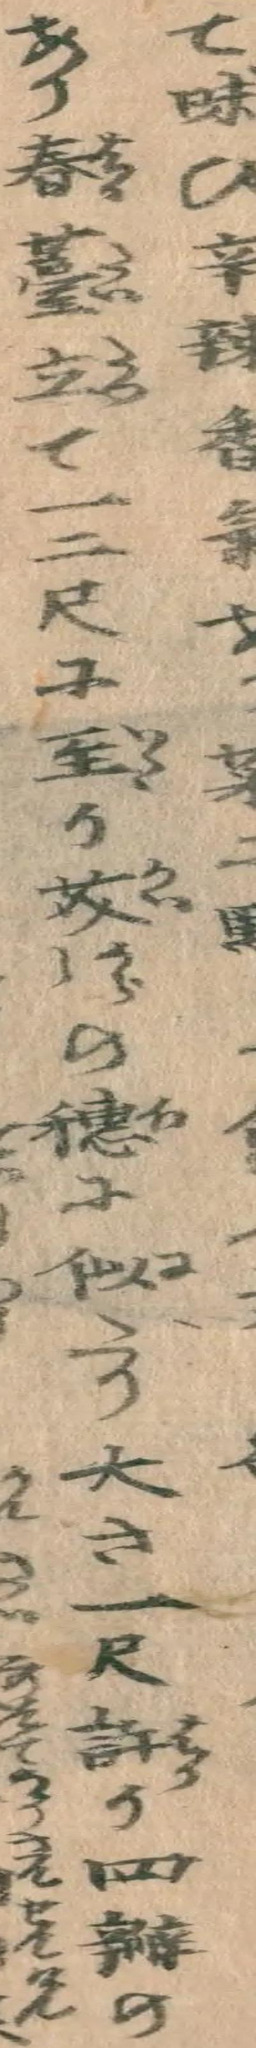あり春薹立て一二尺に至り芥からしの穂に似たり大さ一尺許り四弁の

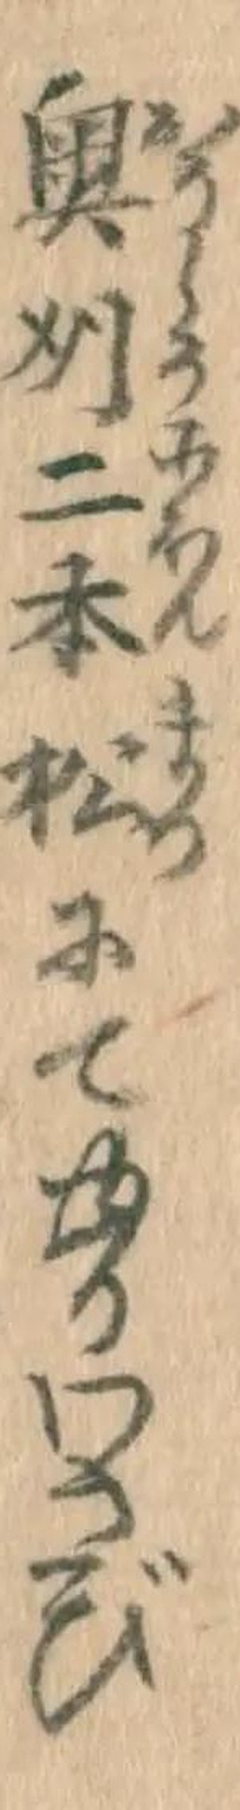奥州二本松にてゆりわさび
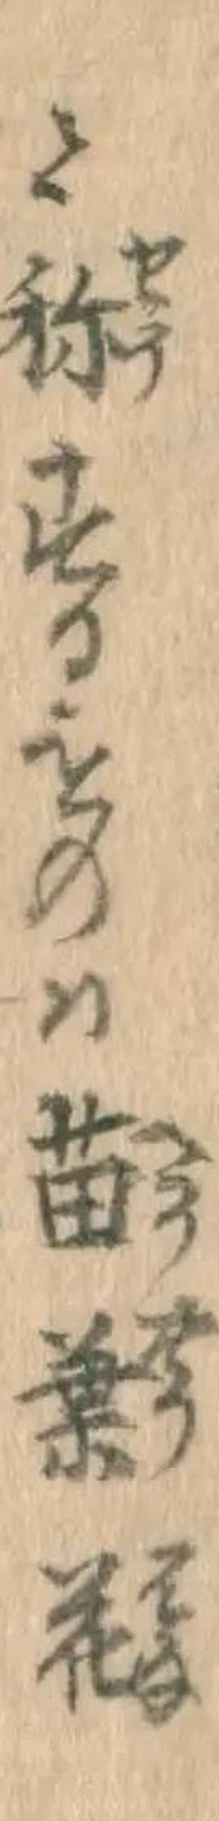と称するものは苗葉花
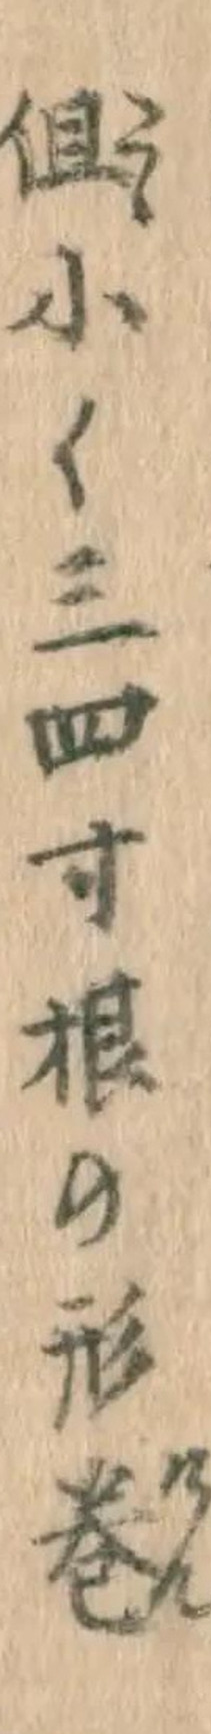但小く三四寸根の形巻
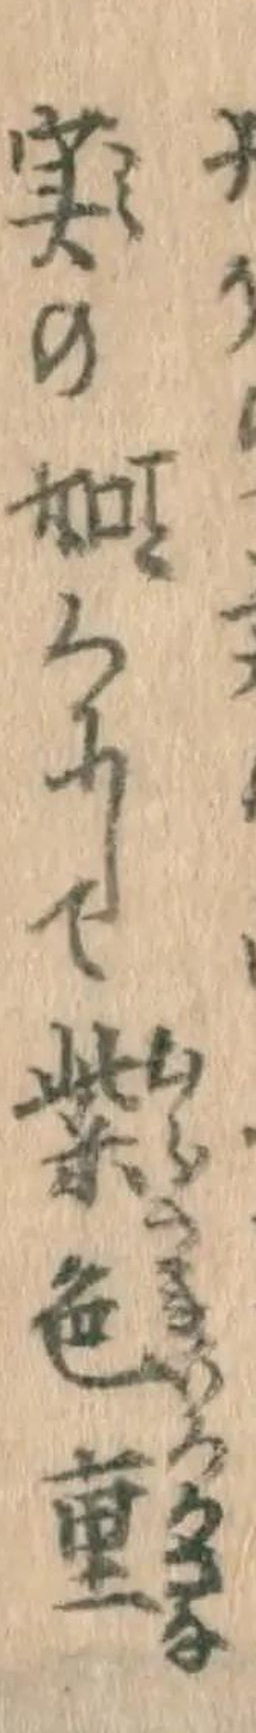実の如くにして紫色重
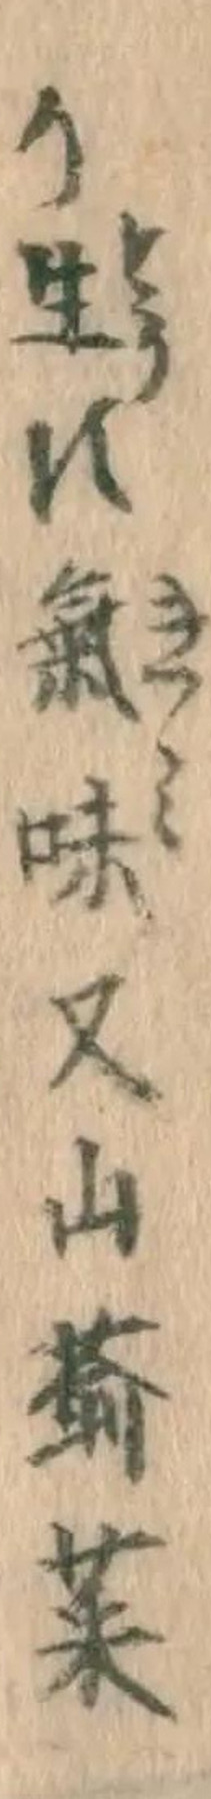り生す気味又山萮菜
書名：本草図譜. 巻46-48
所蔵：国立国会図書館 National Diet Library, JAPAN
